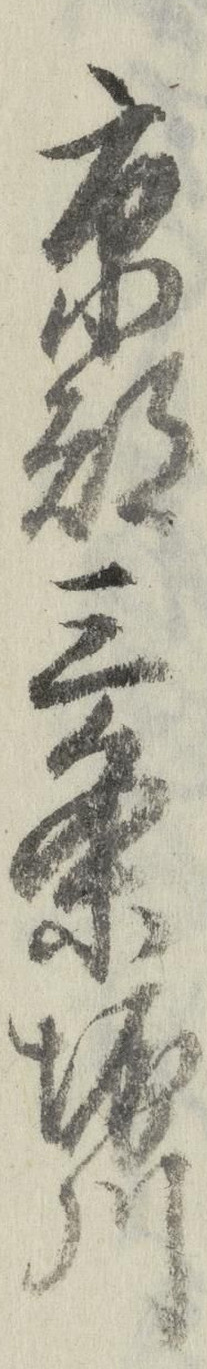京都三条堀川
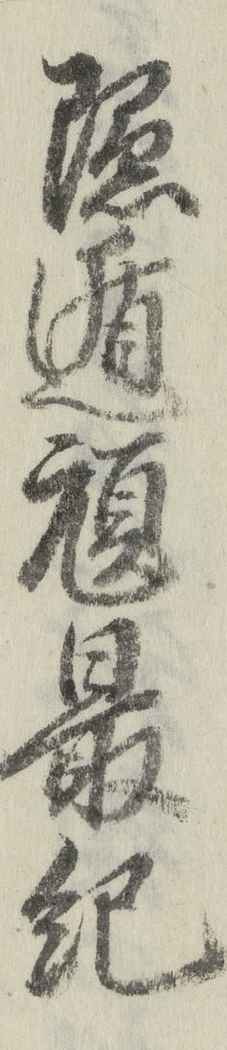隠遁頑最紀
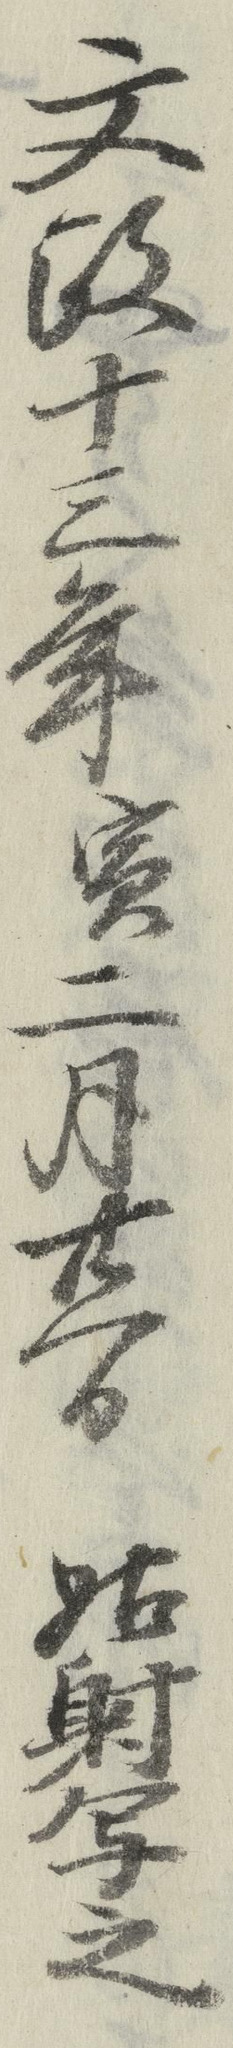文政十三年寅二月廿一日姑射写之
